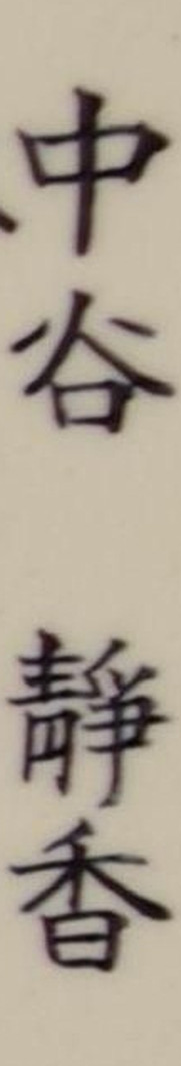中谷静香
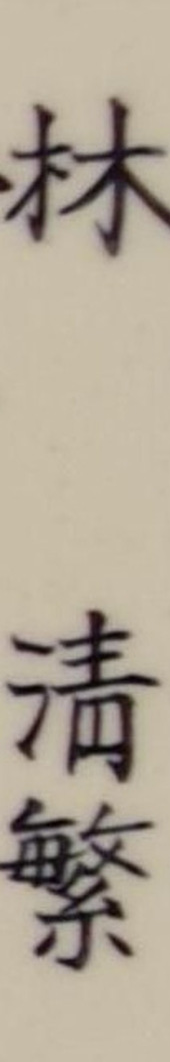林清繁
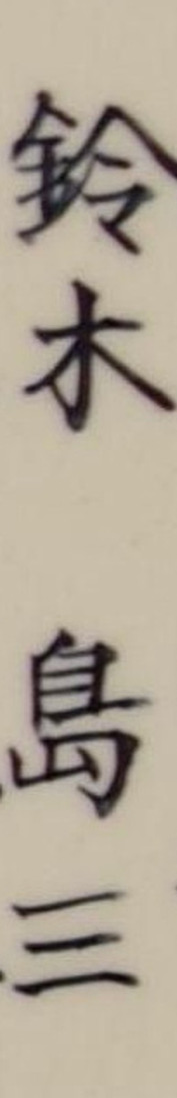鈴木島三
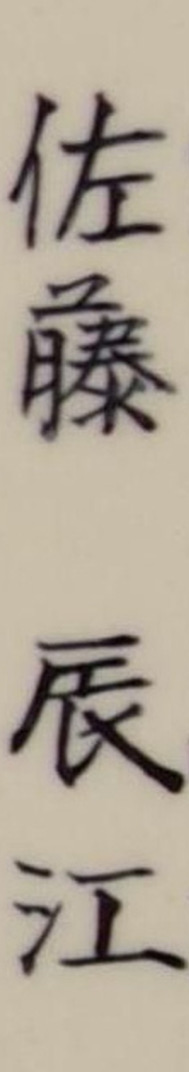佐藤辰江
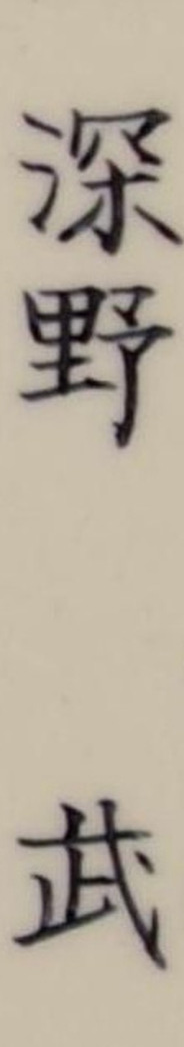深野武
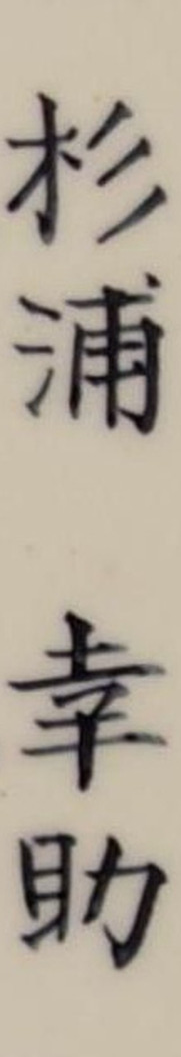杉浦幸助
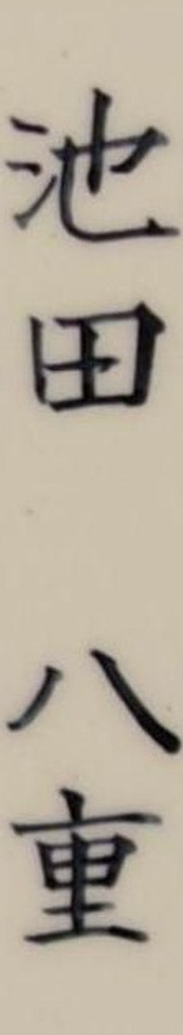池田八重
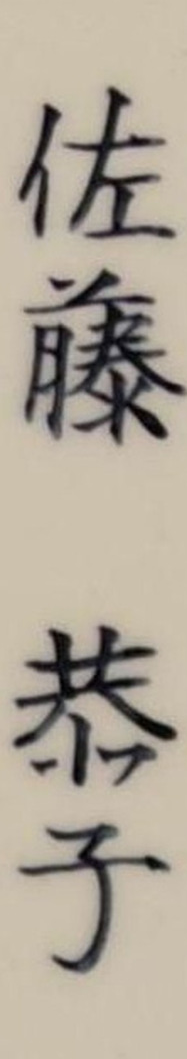佐藤恭子
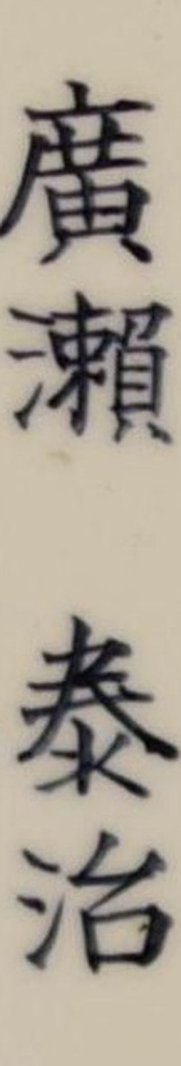廣瀬泰治
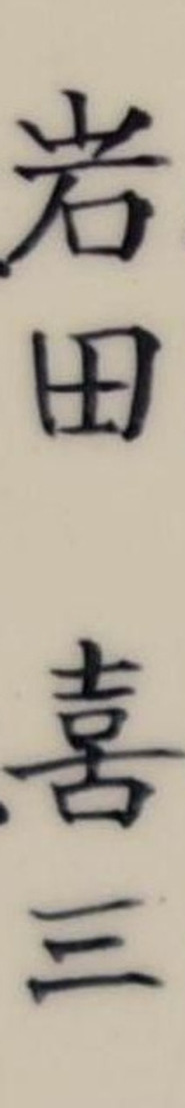岩田喜三
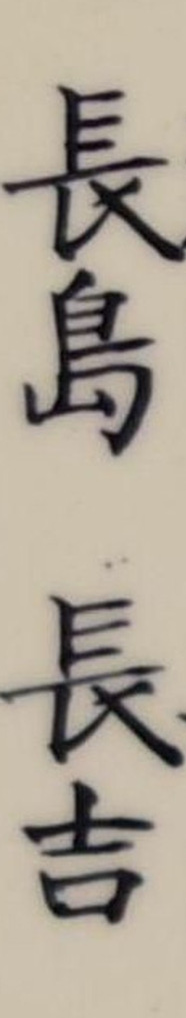長島長吉
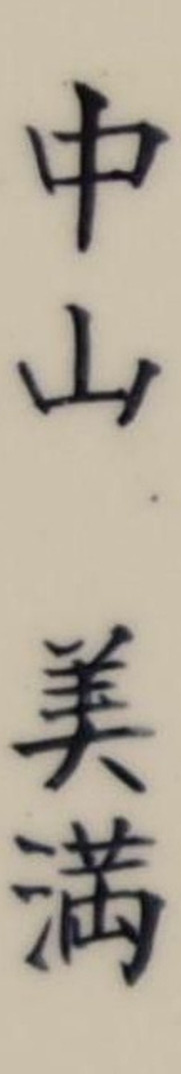中山美満
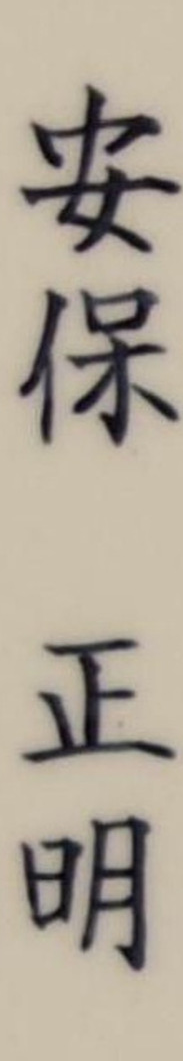安保正明
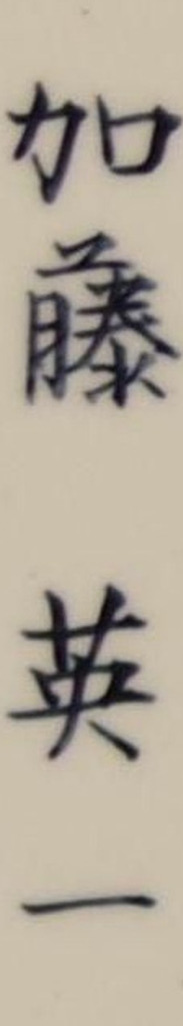加藤英一
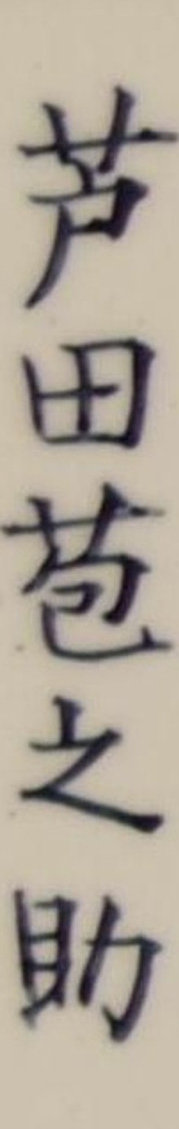芦田苞之助
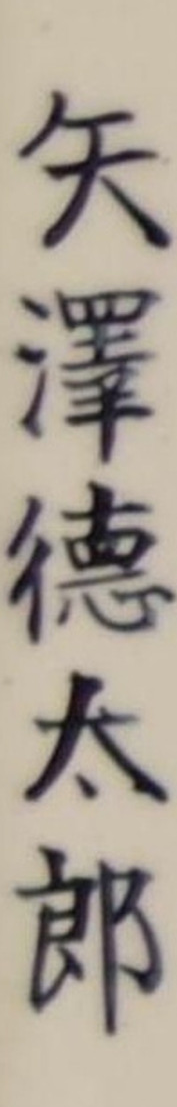矢澤徳太郎
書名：M~S
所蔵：高野山金剛峯寺
